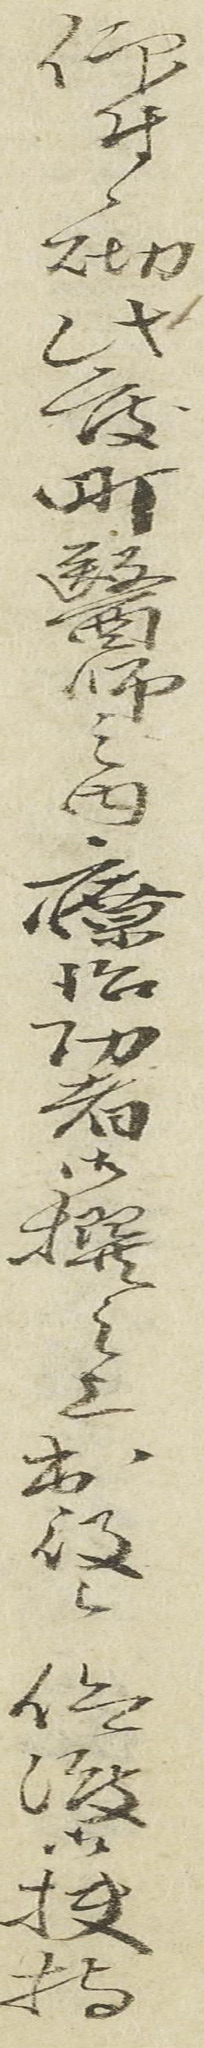仰付候砌此度町医者之内療治巧者御撰之上出役被仰渡御扶持
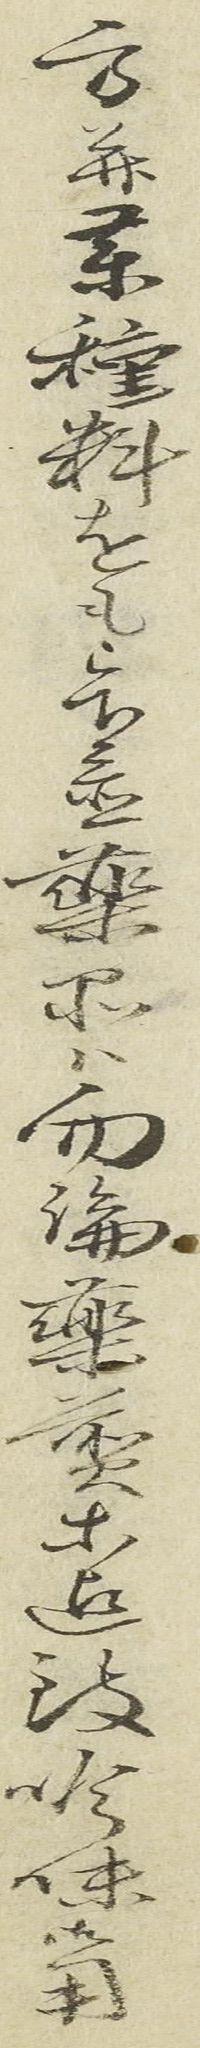方幷薬種料をも被下置薬品ハ勿論薬煎等迄致吟味御用

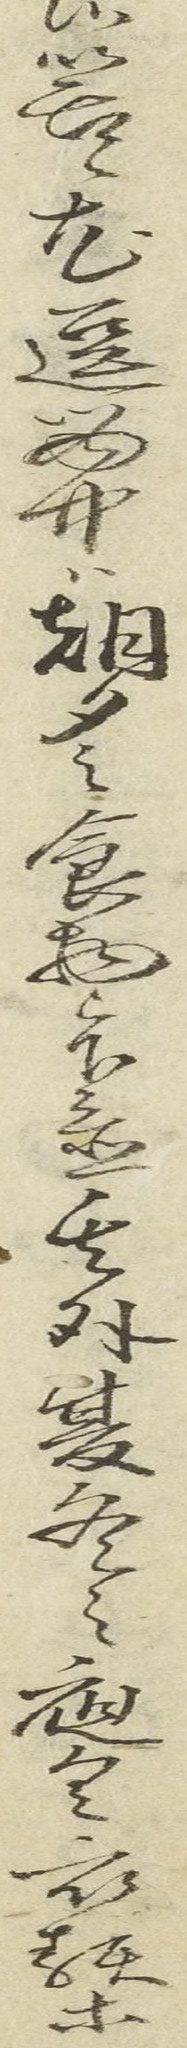候筈候尤逗留中ハ朝夕之食物被下置其外夏冬の夜具衣類等
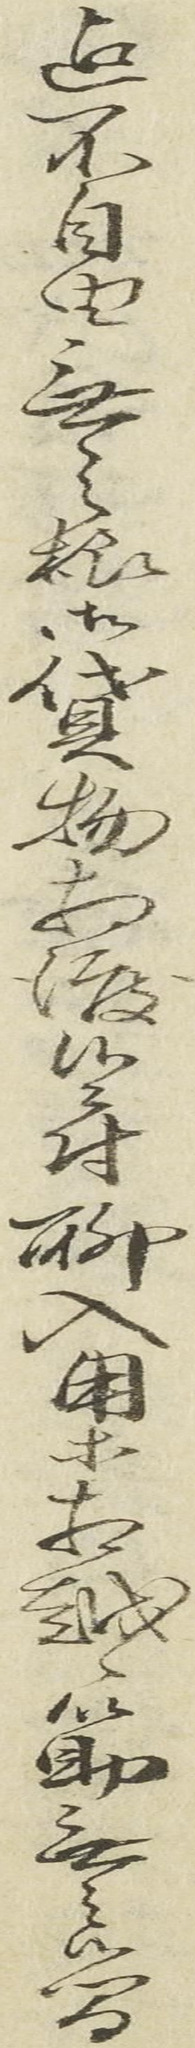迄不自由無之様御貸物相渡候ニ付聊か入用等相越候筋無之候間
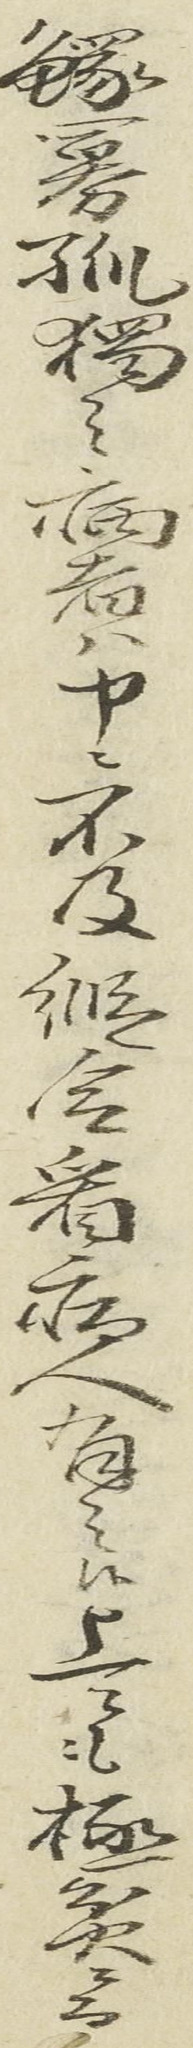鰥寡孤独之病者ハ申ニ申ニ不及縱令看病人有之候上ニも極貧二而
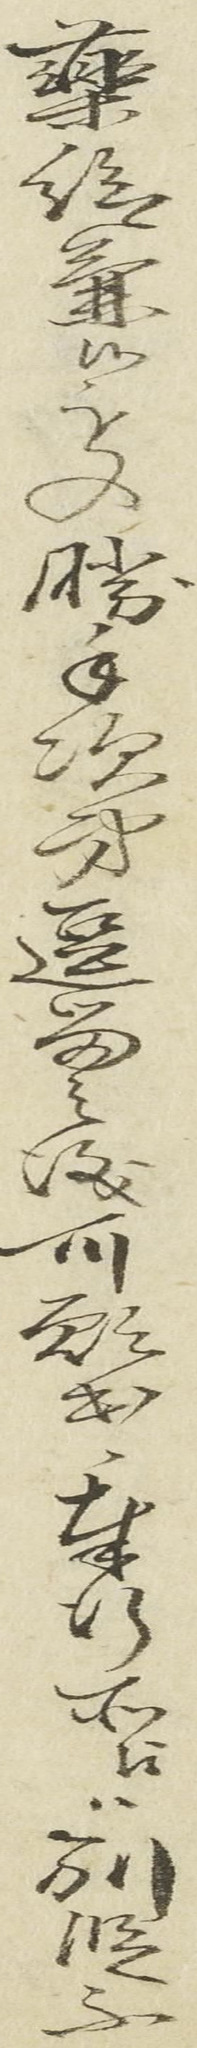薬給兼候者勝手次第逗留之儀可願出候奉行所えハ別段不
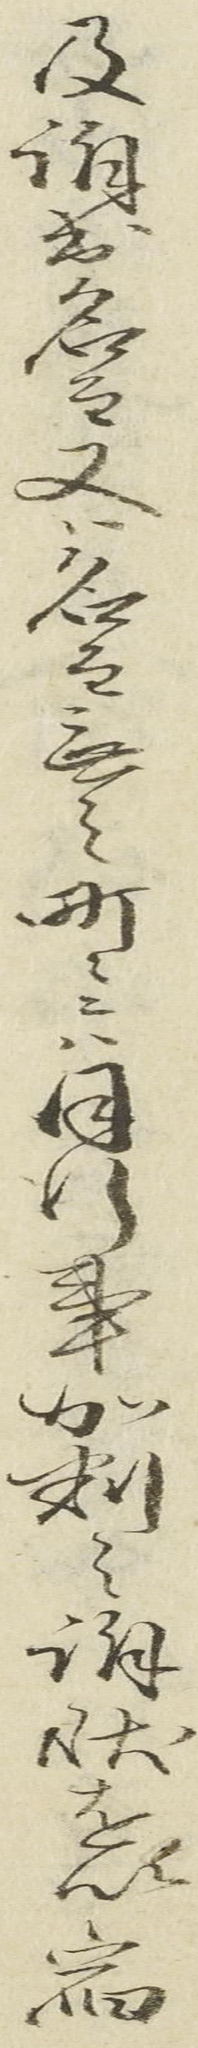及訴出名主又ハ名主無之町々ニハ月行事加判之訴状を以宿
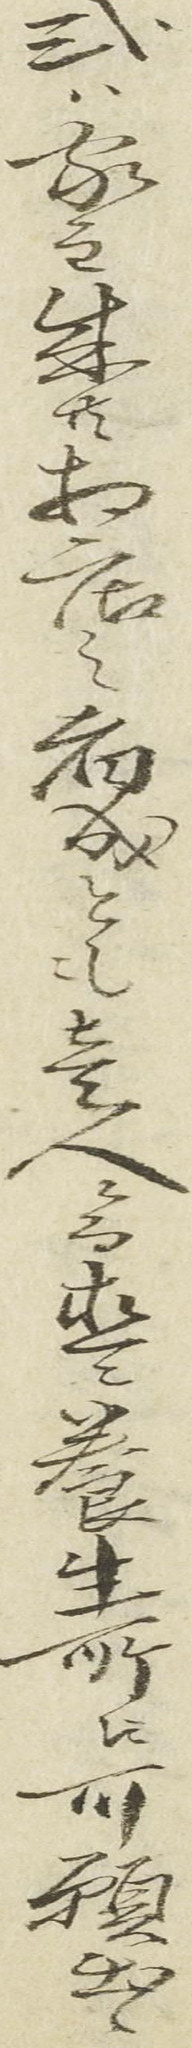或ハ家主来共お店之者成共壱人ニ而直ニ養生所え可願出候
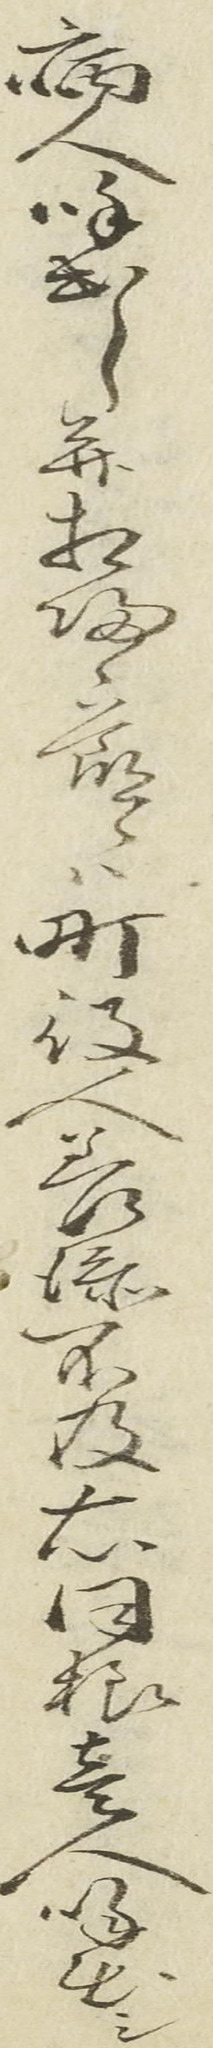病人呼出し幷相帰候節ハ町役人差添不及右同様壱人呼出し
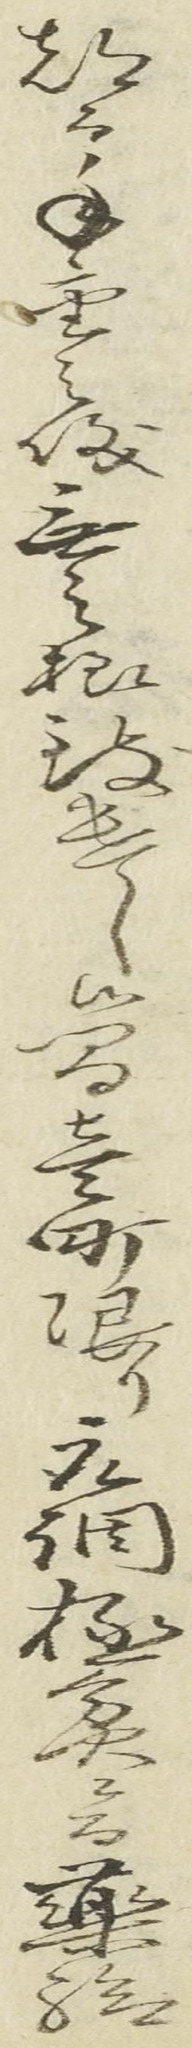都而手空之儀無之様致遣し候間壱町限り取調極貧ニ而薬給
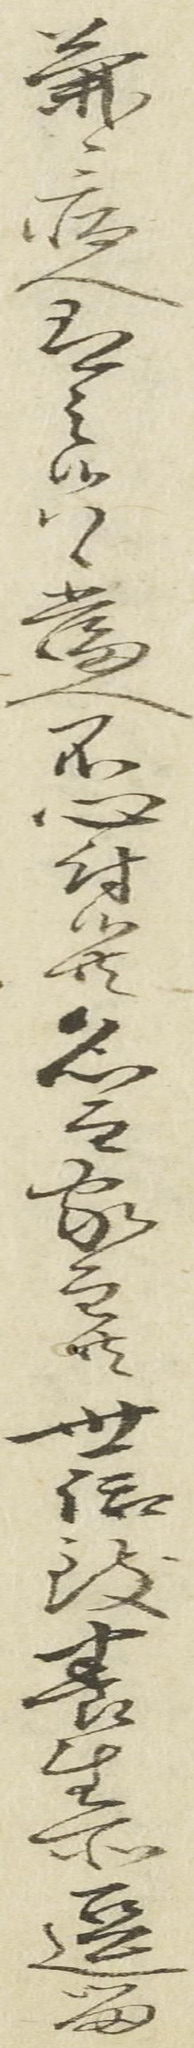兼々病人有之候ハゝ当人不心付候共名主家主共世話致養生所逗留
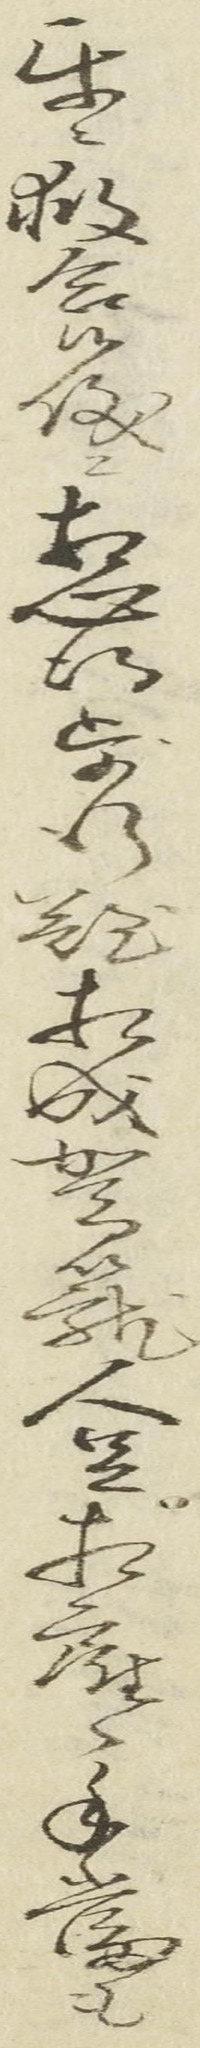互二救合候儀ニ相心得歩行難相成駕籠人足相雇候手当も
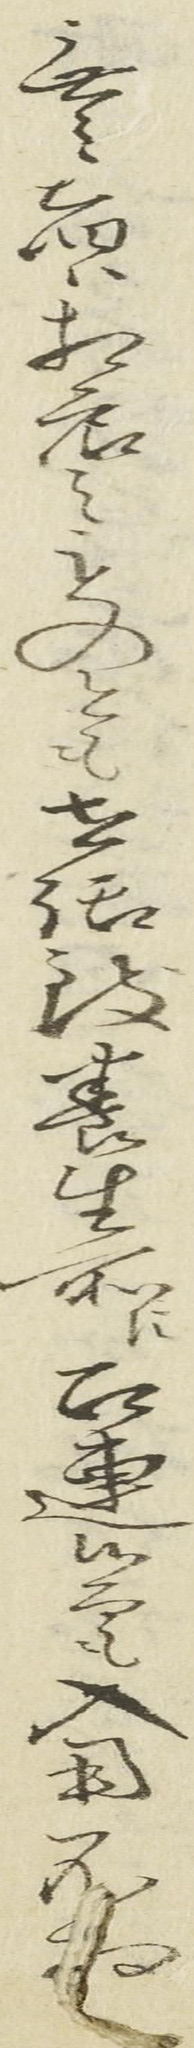無之者ハお店之ものとも世話致養生所え召連候而も入用
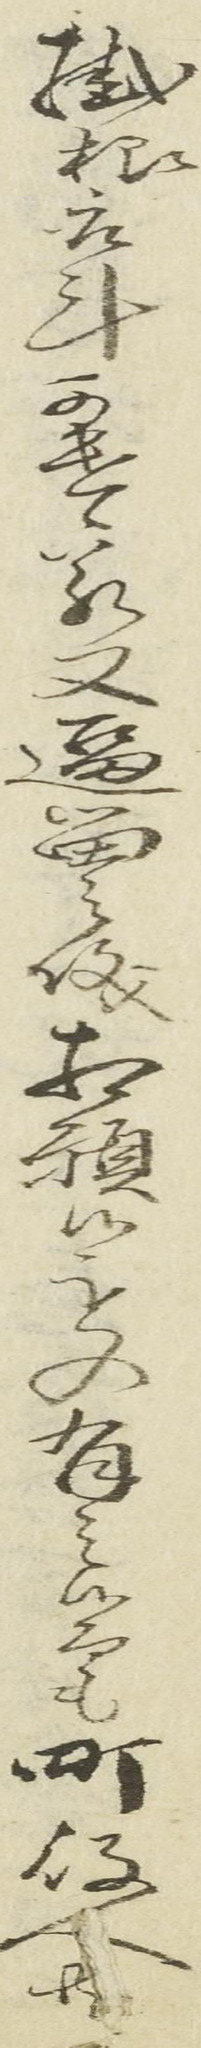掛根取斗可遣候若又逗留之儀相願候もの有之候而も町役人共
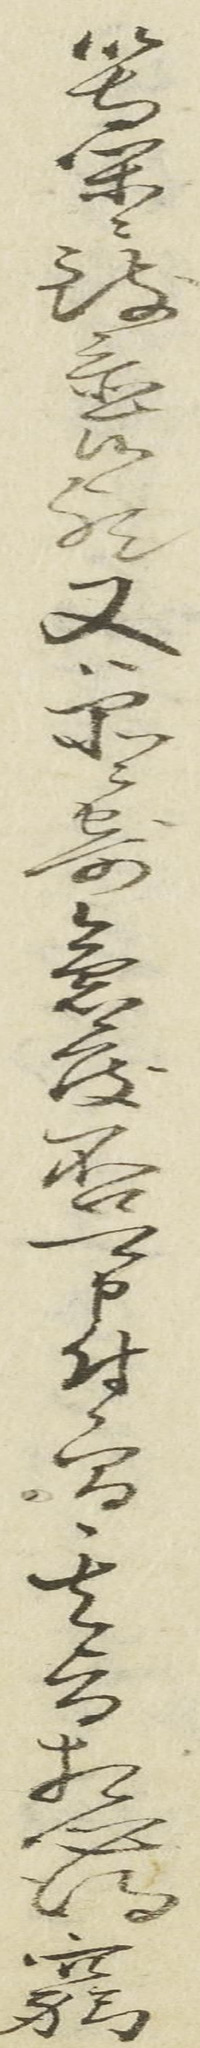等閑二致置候歟又ハ品々寄急度否可申付候間其旨相心得窮
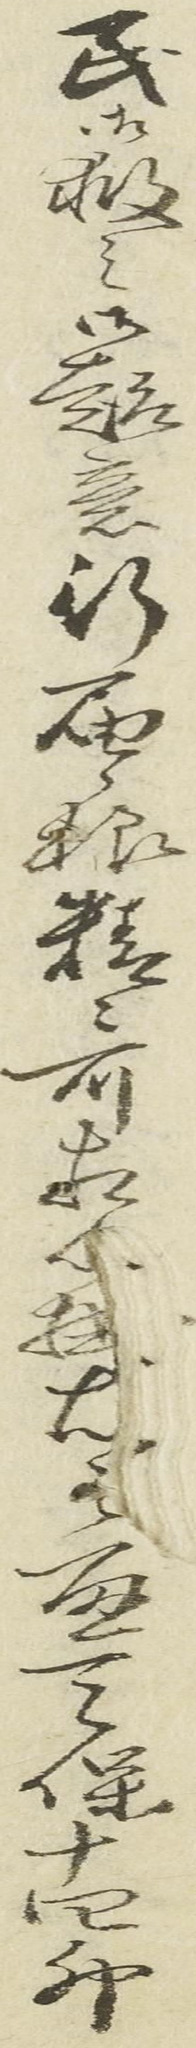民御救之御趣意行届候様精々可相心掛右之通天保十四卯
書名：安政二乙卯年十月二日大地震之事
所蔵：東京大学地震研究所図書室 Earthquake Research Institute Library, The University of Tokyo, JAPAN
